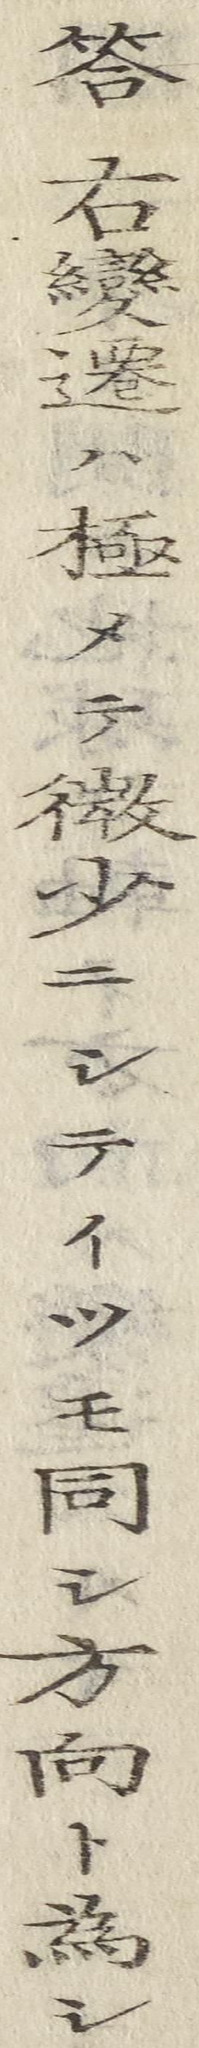答右変遷ハ極メテ微少ニシテイツモ同シ方向ト為シ
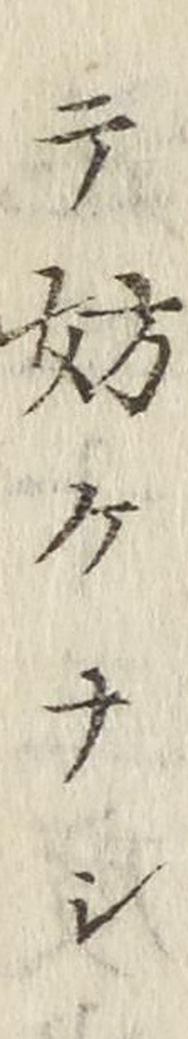テ妨ケナシ
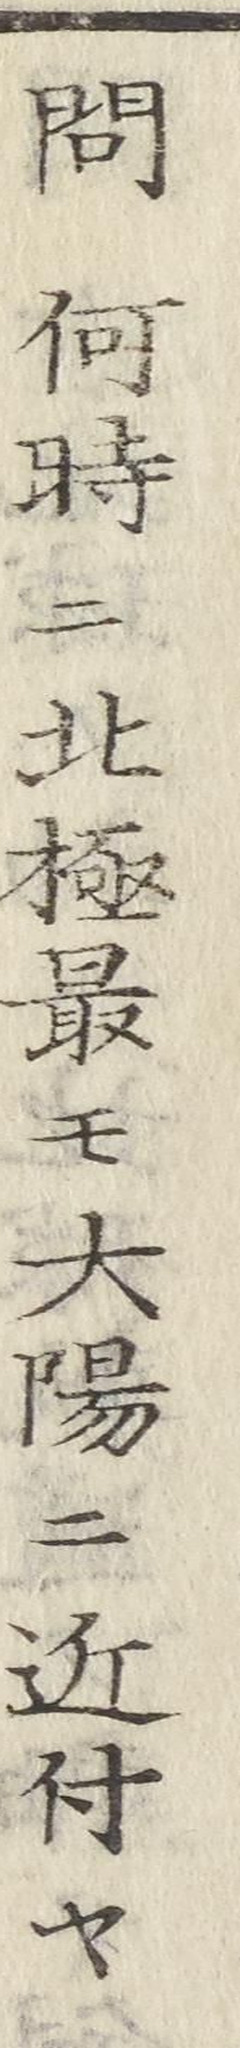問何時ニ北極最モ大陽ニ近付ヤ
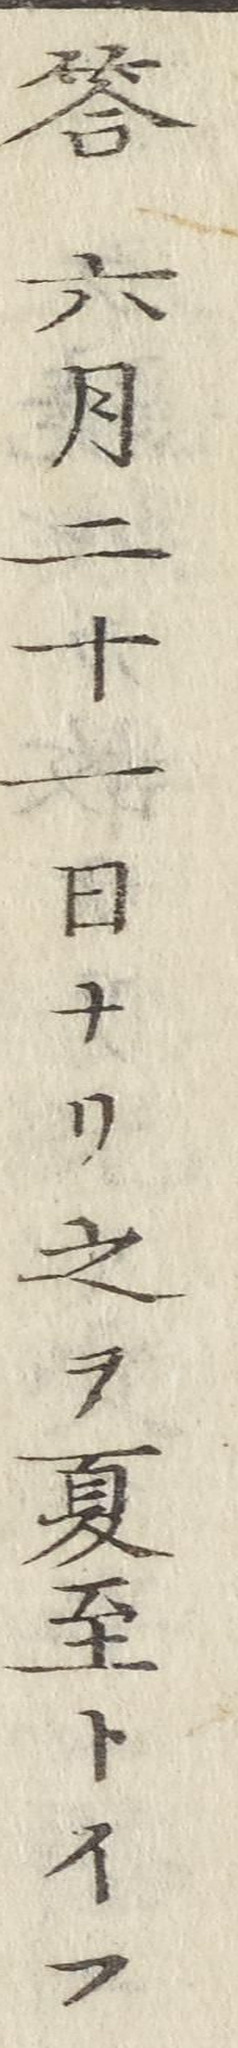答六月二十一日ナリ之ヲ夏至トイフ
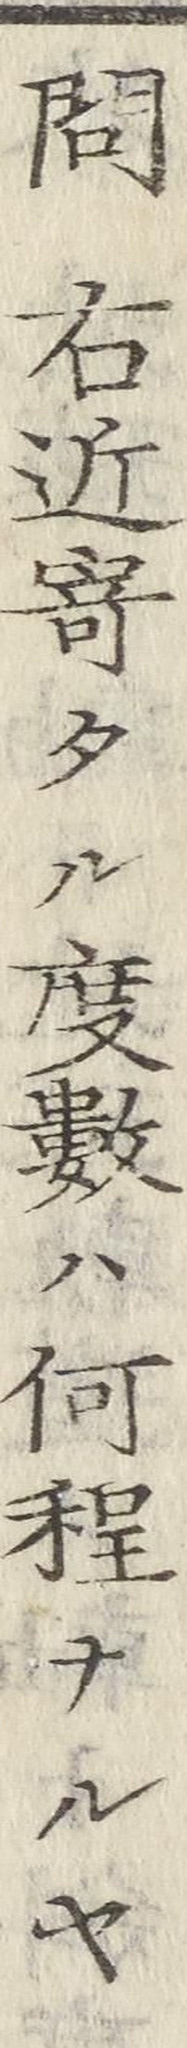問右近寄タル度数ハ何程ナルヤ
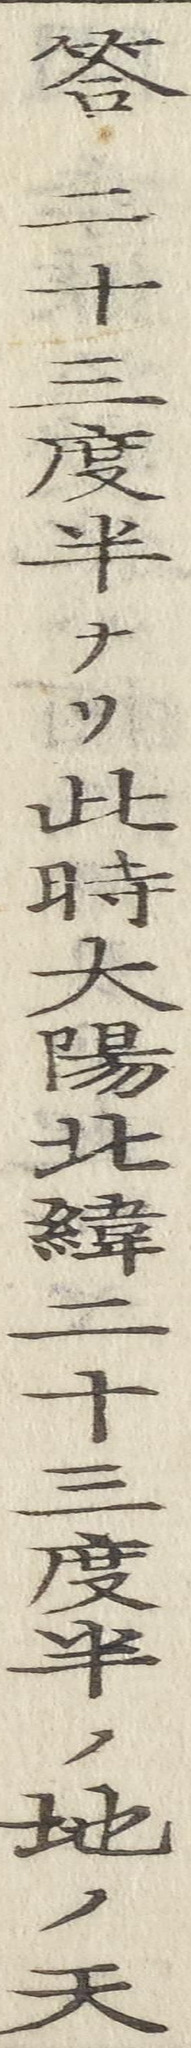答二十三度半ナリ此時大陽北緯二十三度半ノ地ノ天
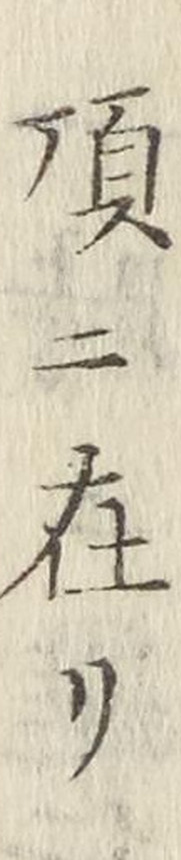頂ニ在リ
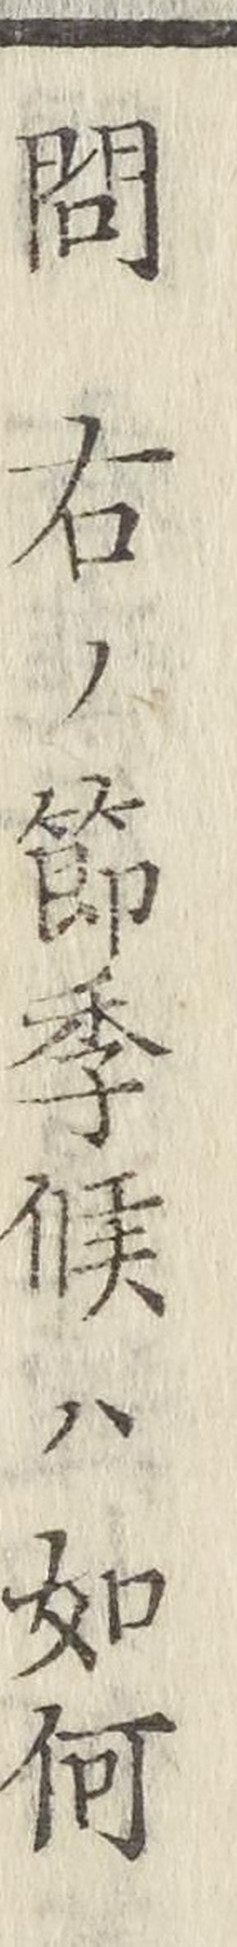問右ノ節季候ハ如何
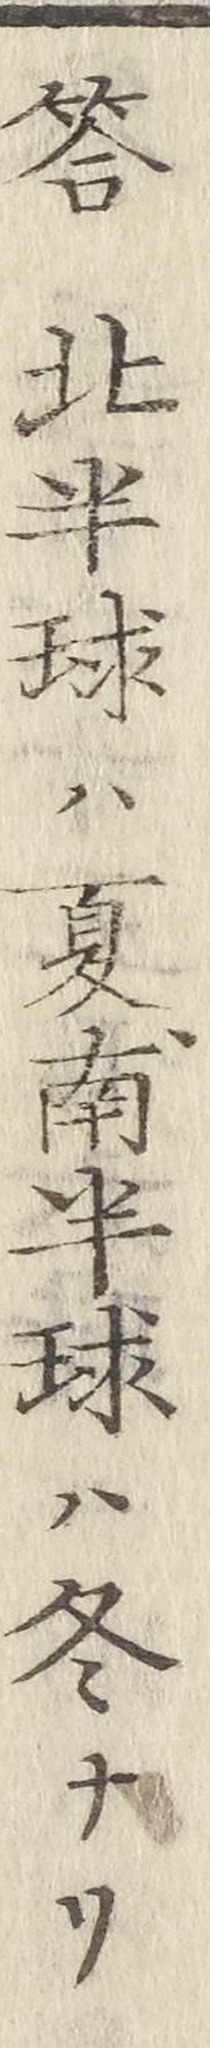答北半球ハ夏、南半球ハ冬ナリ
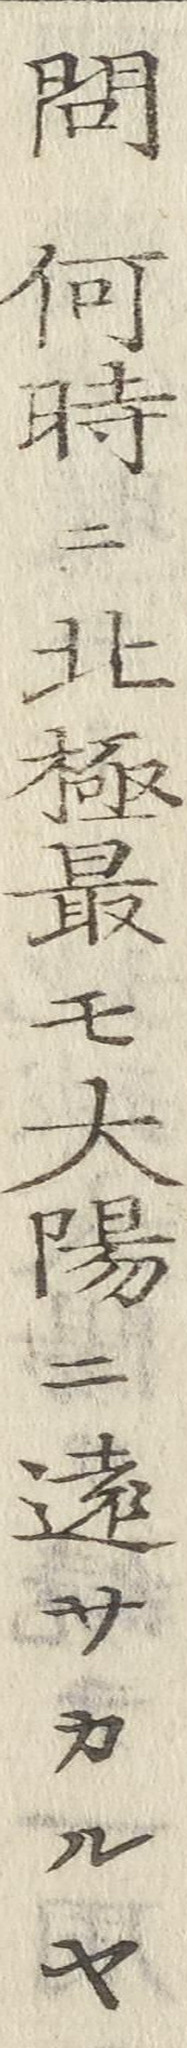問何時ニ北極最モ大陽ニ遠サカルヤ
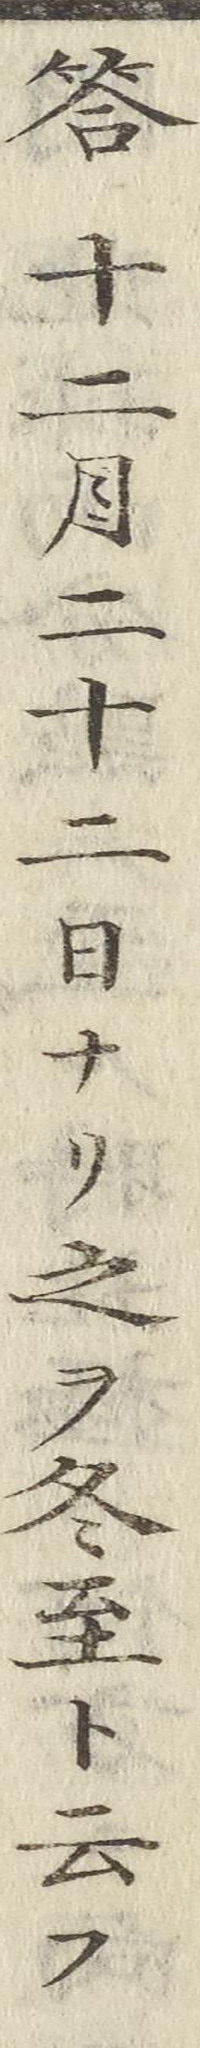答十二月二十二日ナリ之ヲ冬至ト云フ
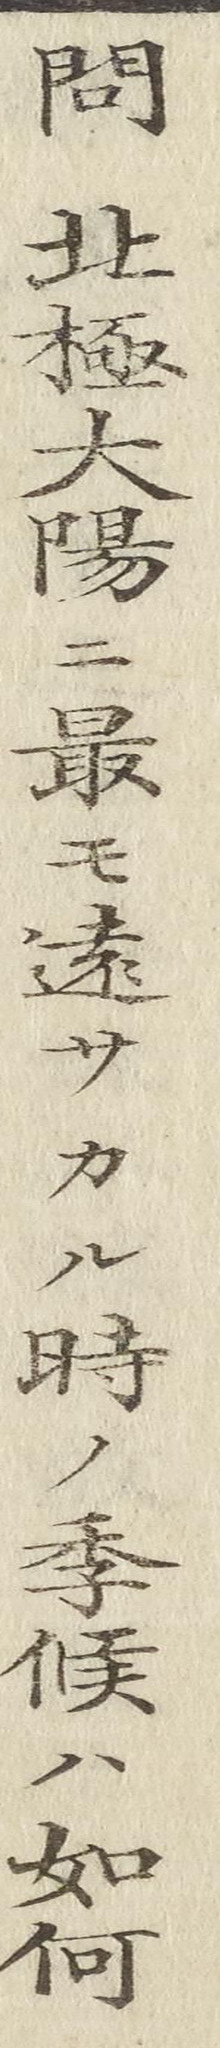問北極大陽ニ最モ遠サカル時ノ季候ハ如何
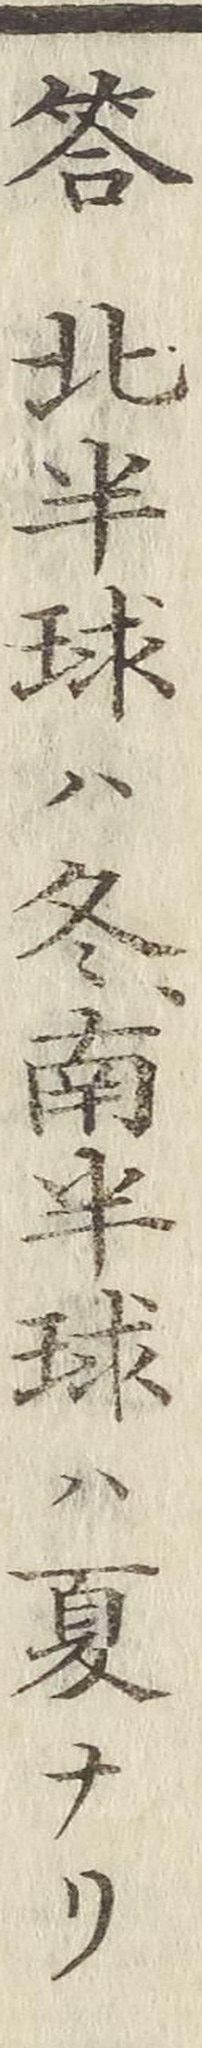答北半球ハ冬、南半球ハ夏ナリ
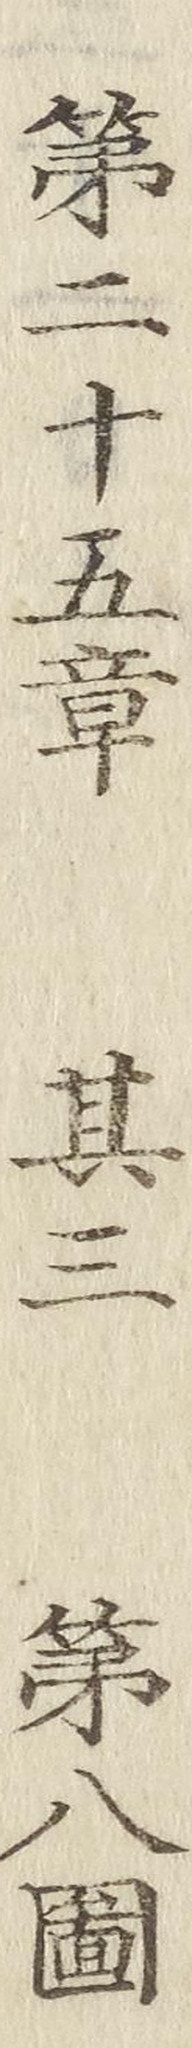第二十五章其三第八図
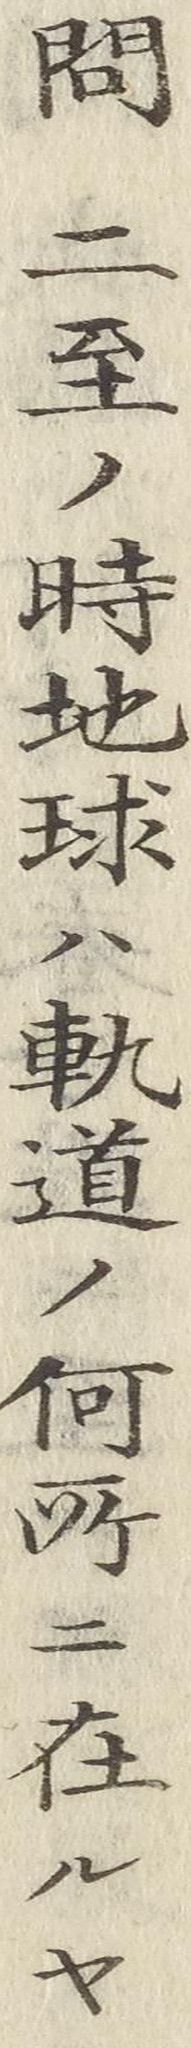問二至ノ時地球ハ軌道ノ何所ニ在ルヤ
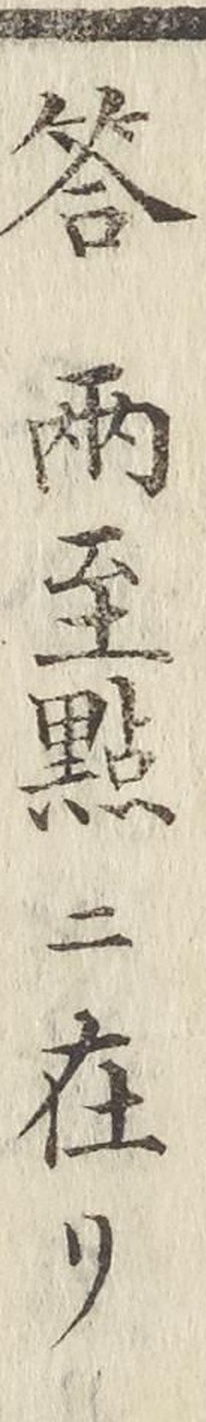答両至点ニ在リ
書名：星学圖説　上
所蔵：東京大学地震研究所図書室 Earthquake Research Institute Library, The University of Tokyo, JAPAN
